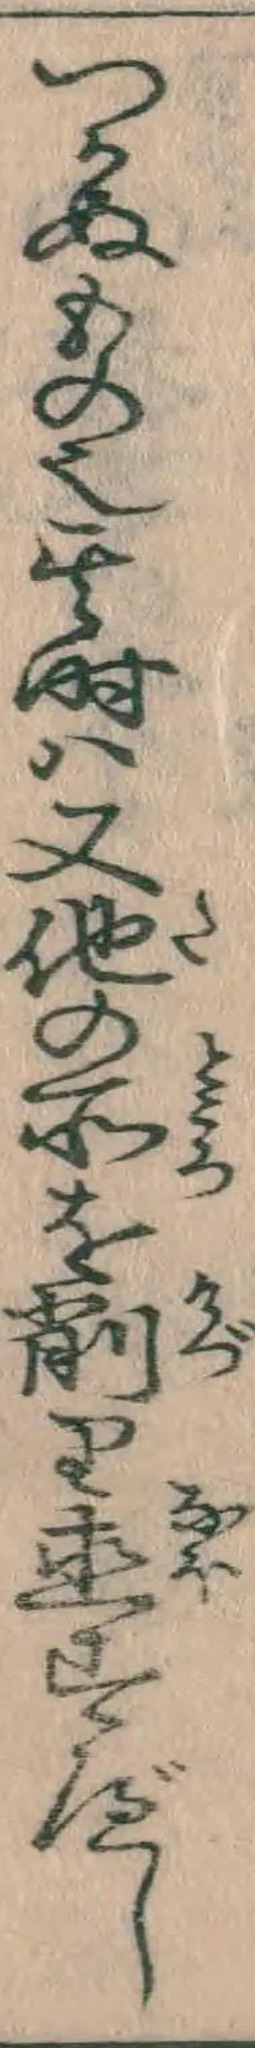つかぬもの也其時は又他の所を削り直すべし
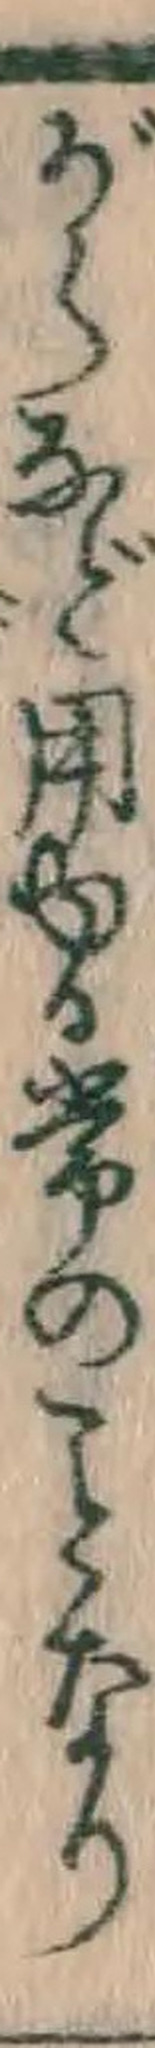がらなど用ゆる常のことなり
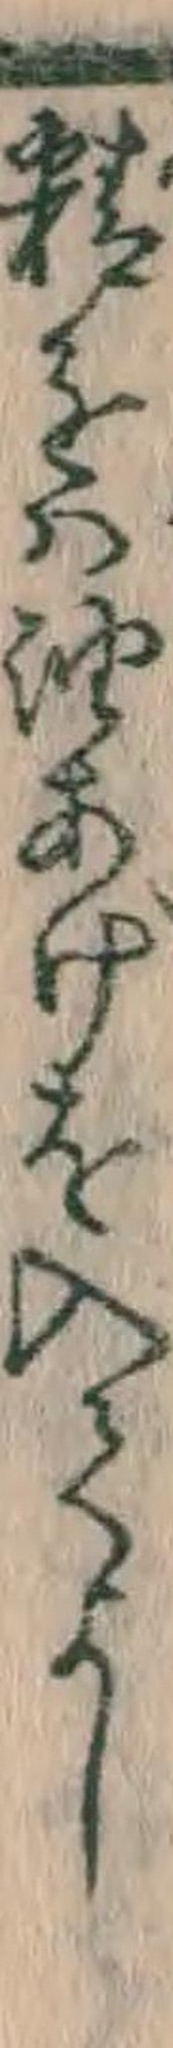精進は油あげを入てよし
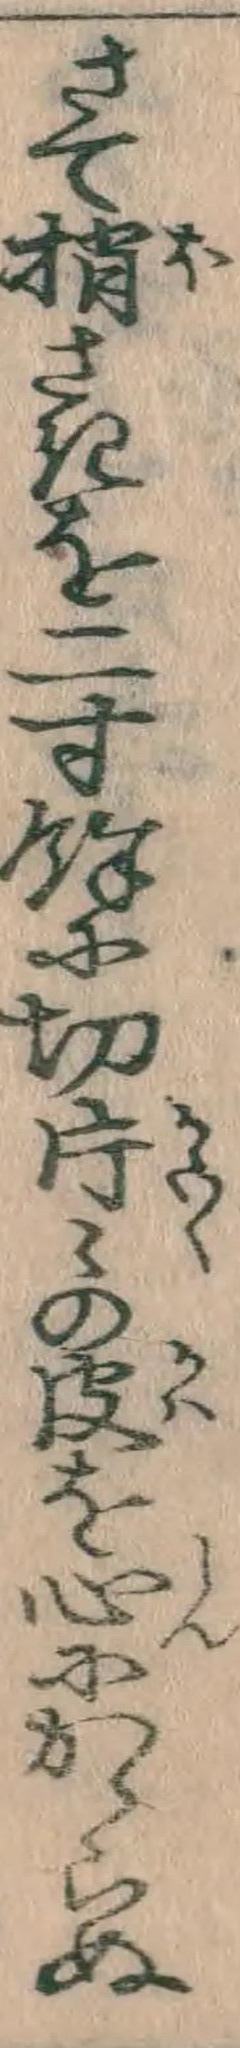さて梢さきを二寸余に切片々の皮を心にかゝらぬ
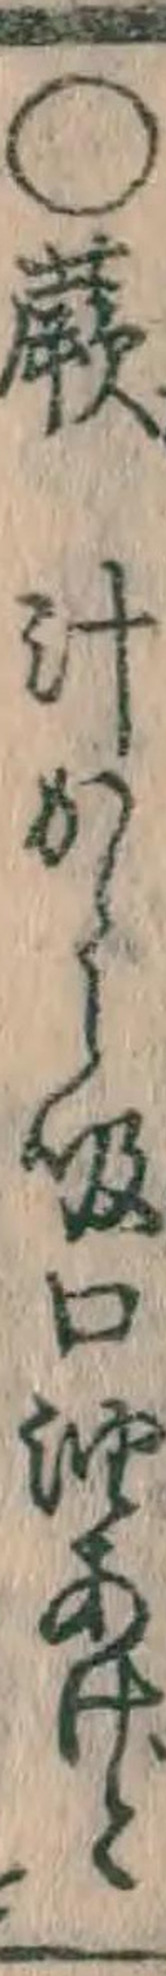○蕨汁からし吸口油あげと
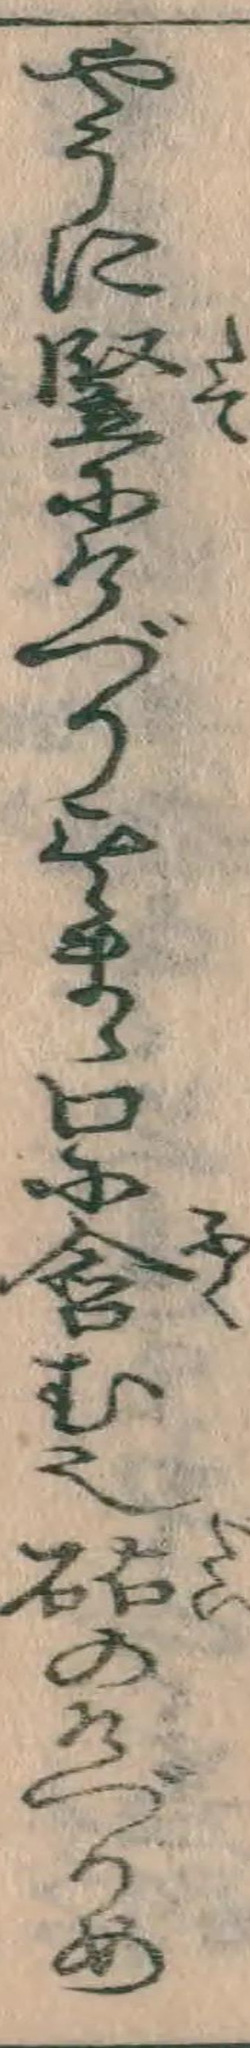やうに竪にけづり其まゝ口に含む也砧のけづりめ
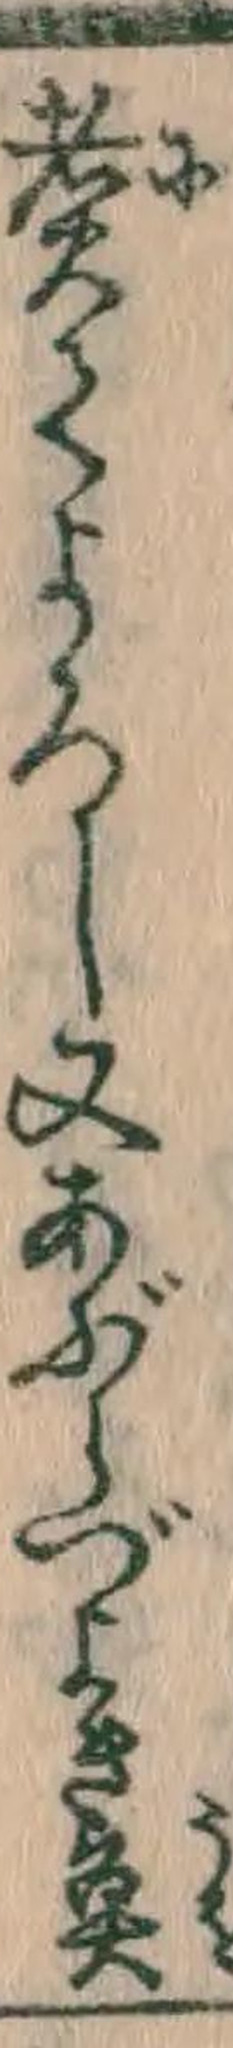煮てよろし又あぶらづよき魚
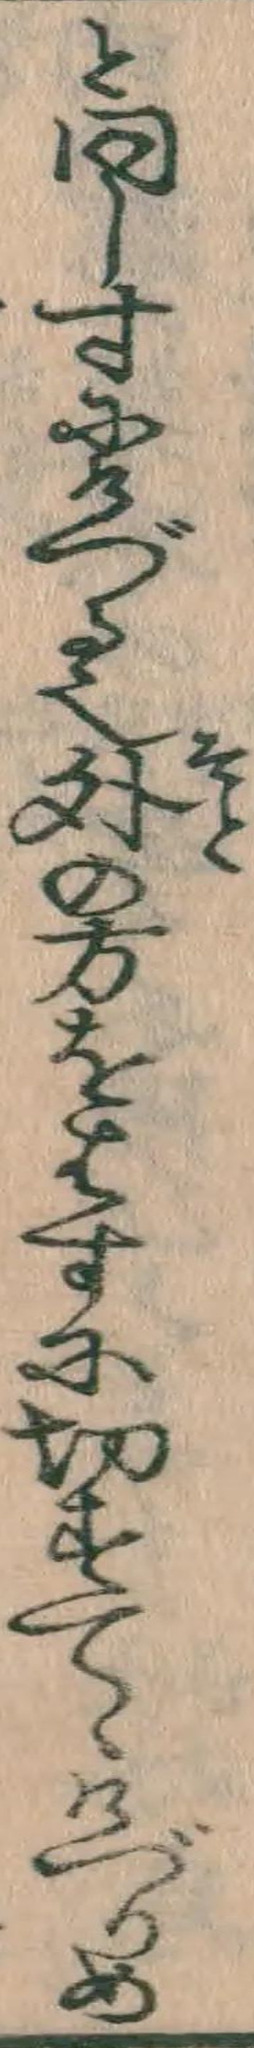と同し寸にけづる也外の方をはすに切すてゝけづりめ
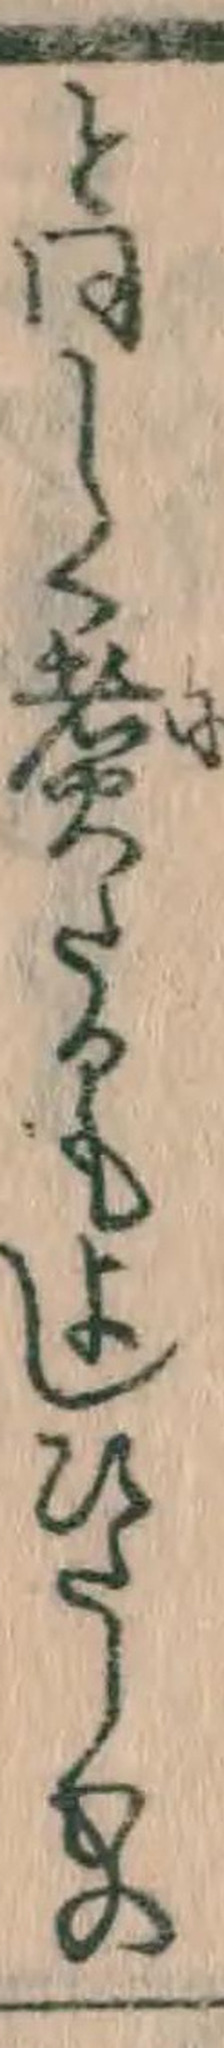と同しく煮たるもよしひたしもの
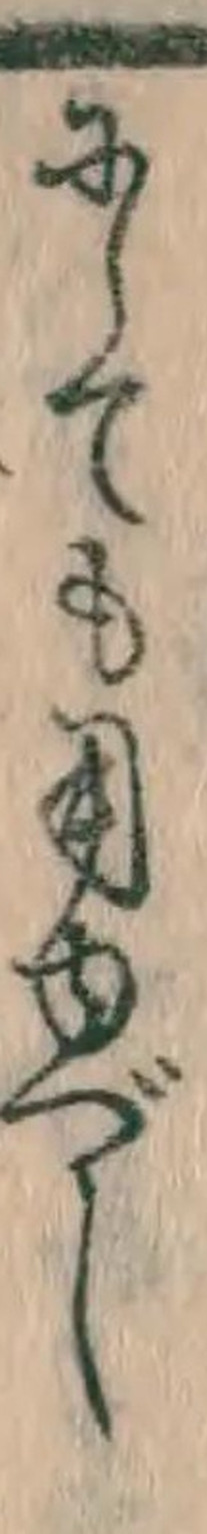にしても用ゆべし
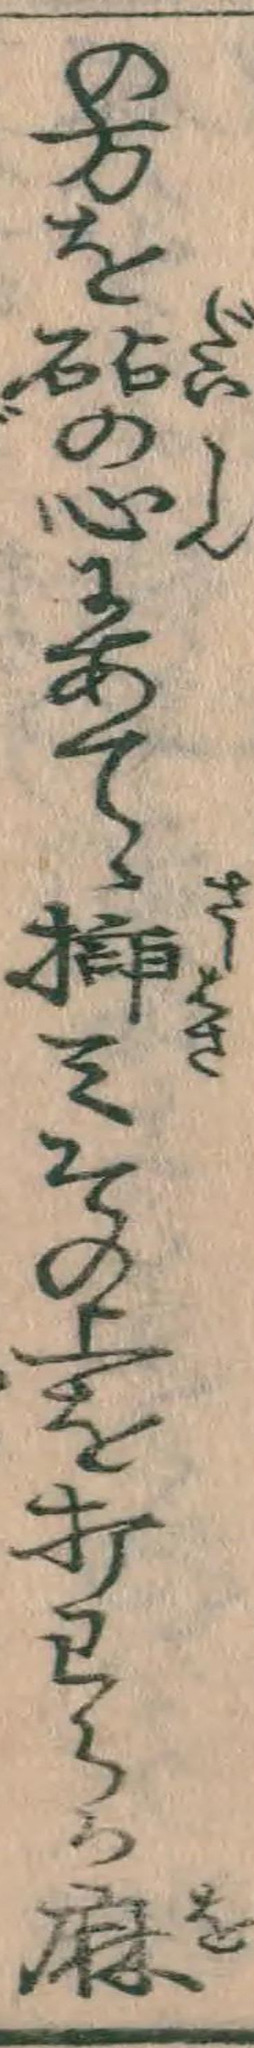の方を砧の心にあてゝ挿みその上を打わらか麻
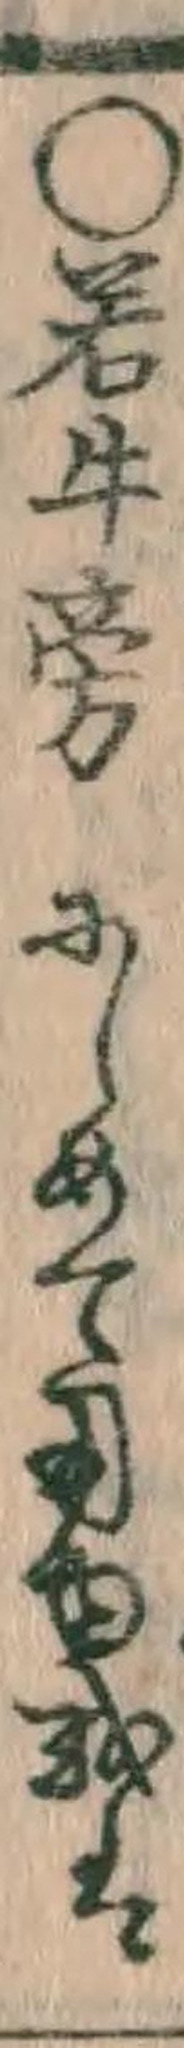○若牛蒡にしめて用ゆ或は
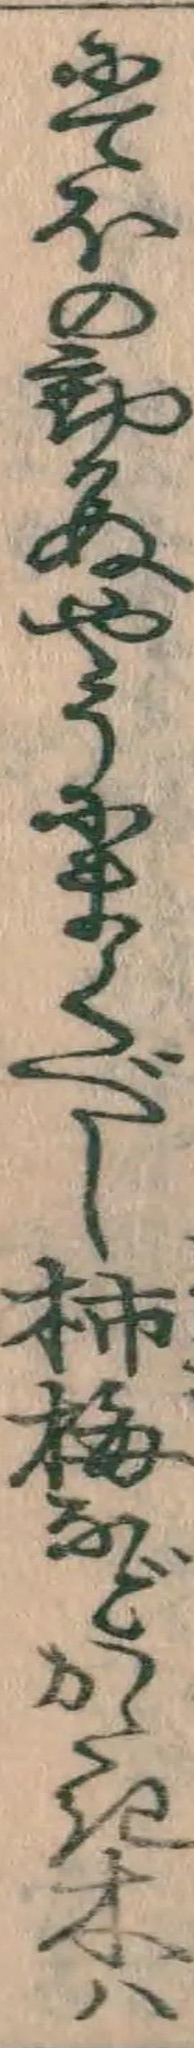にてほの動かぬやうにまくべし柿梅などかたき木は
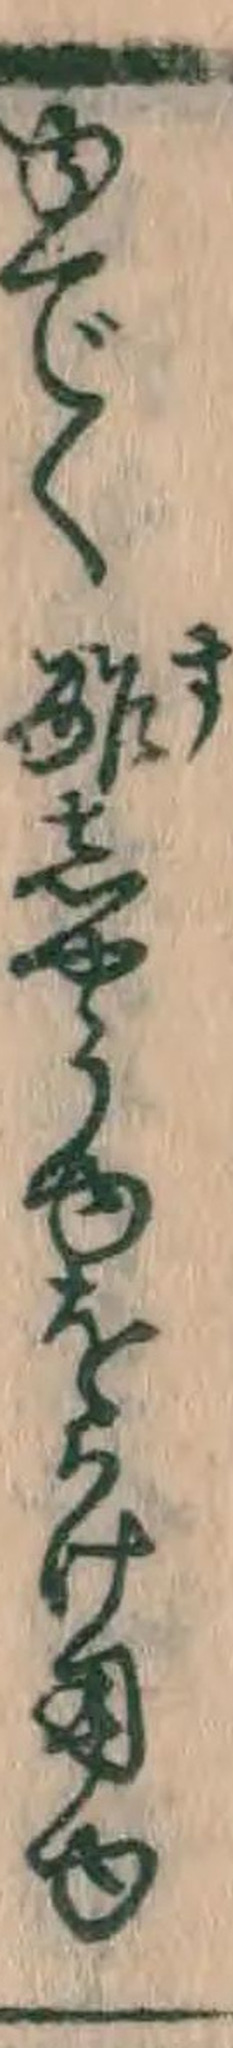ゆでゝ酢しやうゆをかけ用ゆ
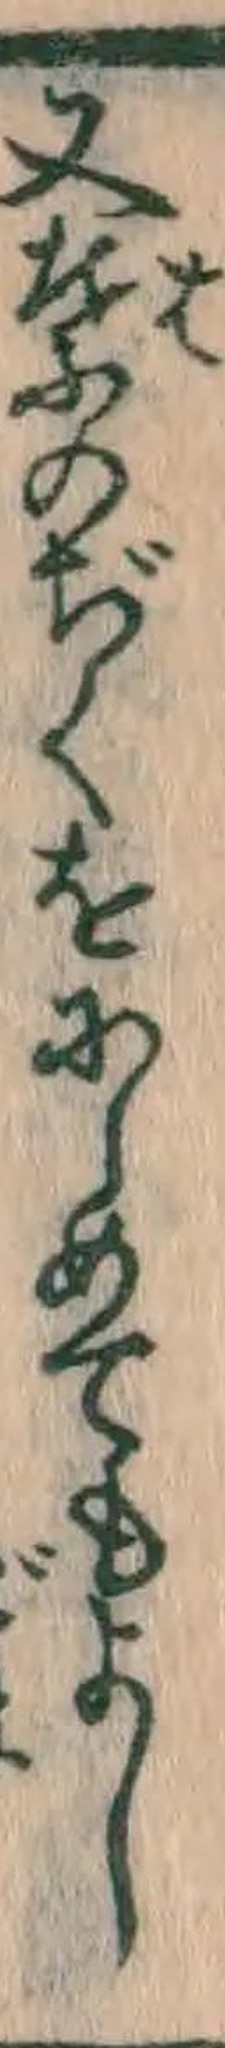又葉のぢくをにしめてもよし
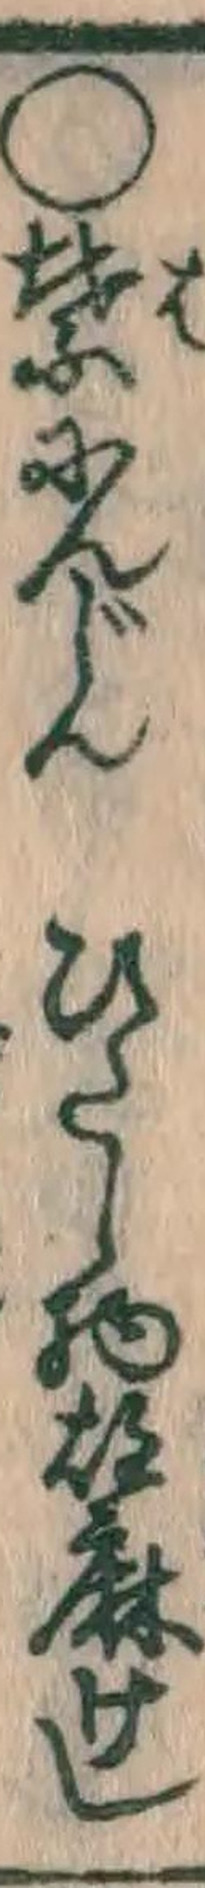○葉にんじんひたし物胡麻けし
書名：広益秘事大全 3巻. [5]
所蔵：国立国会図書館 National Diet Library, JAPAN
